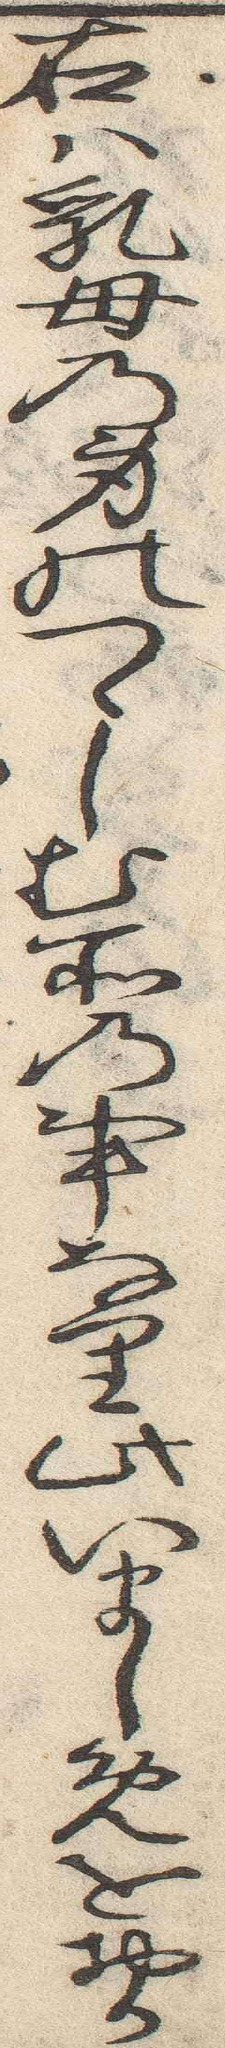右は乳母の身のつゝしむ所の事なり此いましめをおか
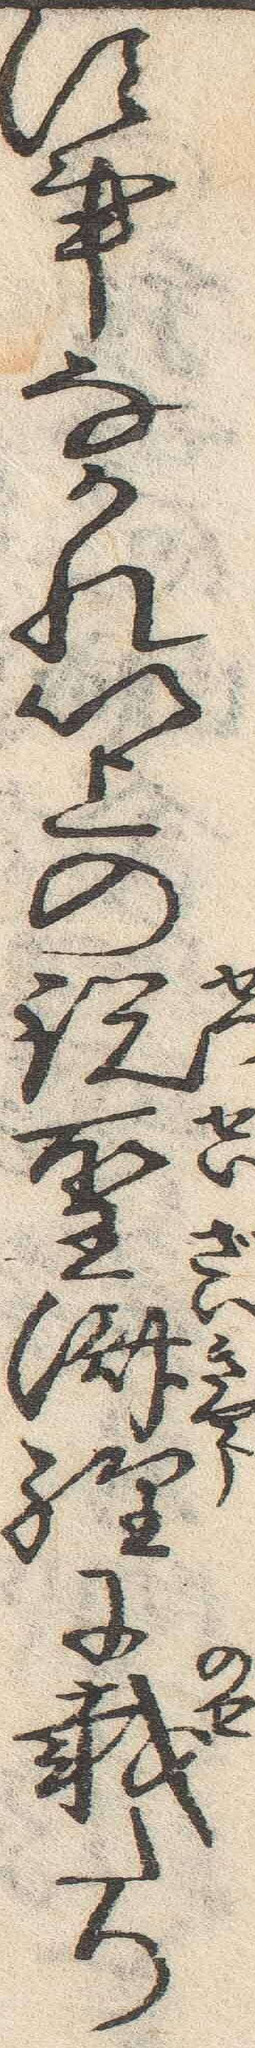す事となかれ以上の説聖濟経に載たり
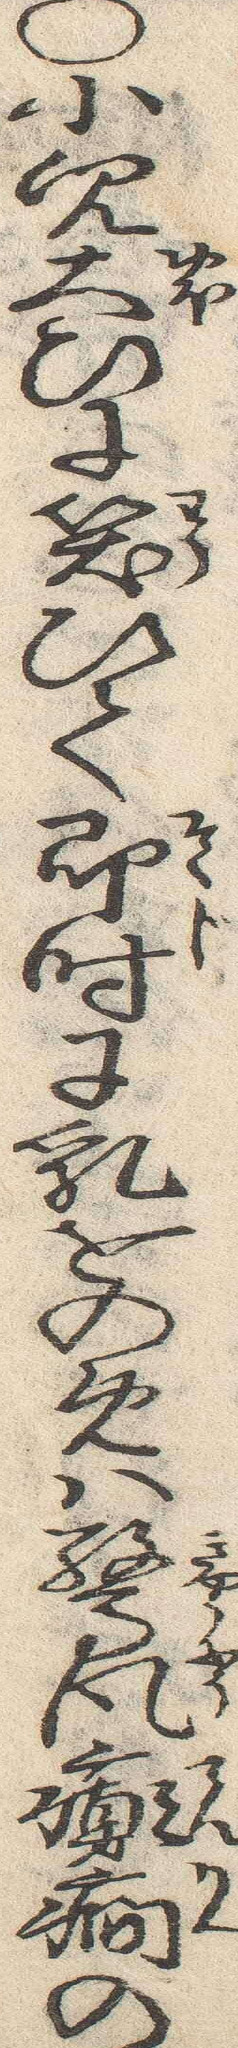◯小児大ひに笑ひて即時に乳をのめは驚風癲癇の
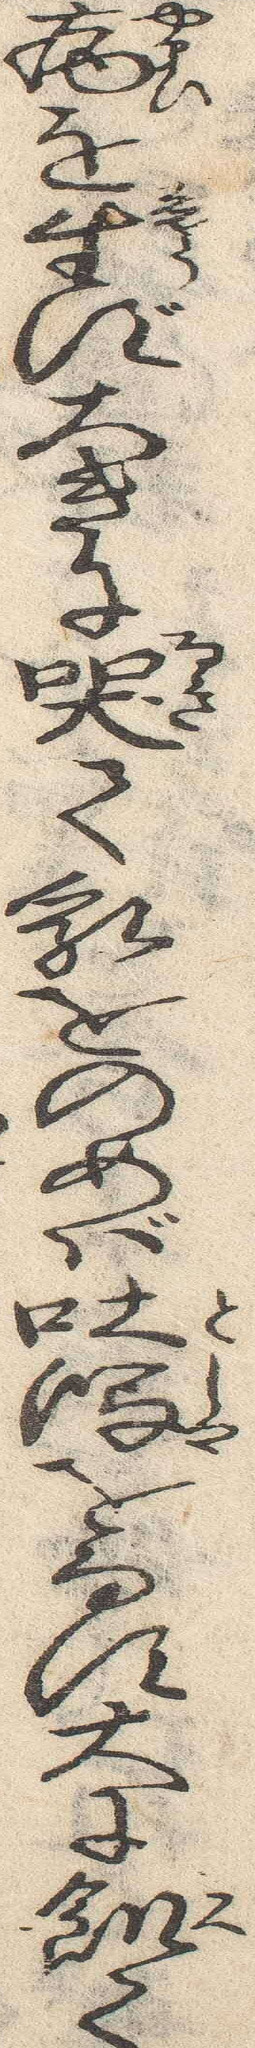病を生ず大きに哭て乳をのめば吐瀉をなす大に飢て
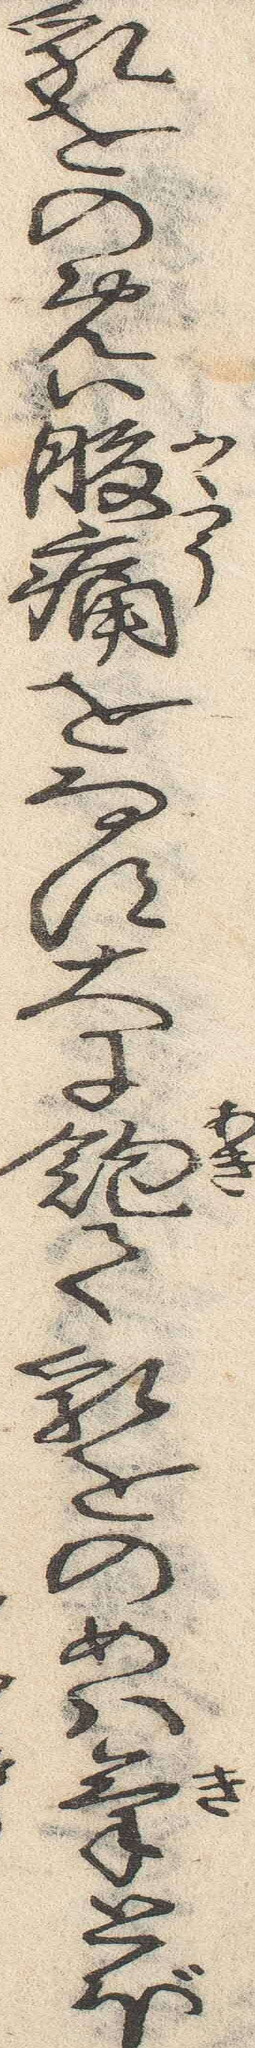乳をのめは腹痛をなす大に飽て乳をのめは氣とぼ
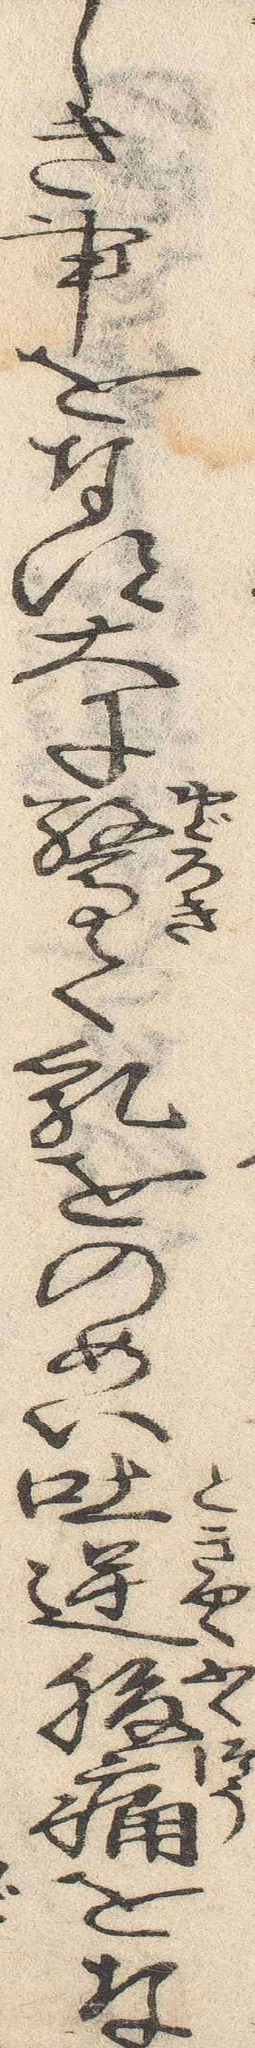しき事をなす大に驚て乳をのめは吐逆腹痛をな
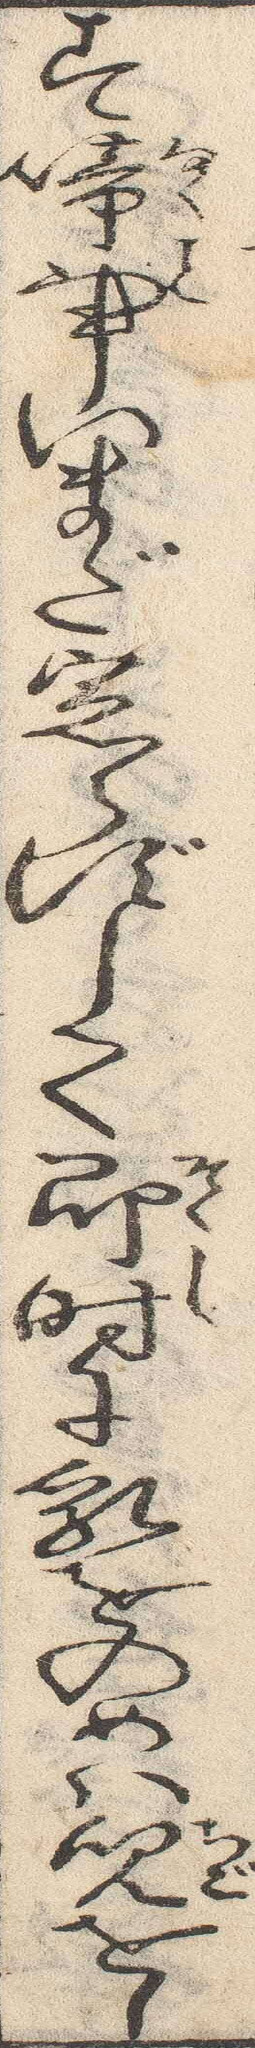す啼事いまだ定らずして即時に乳をのめは児をし
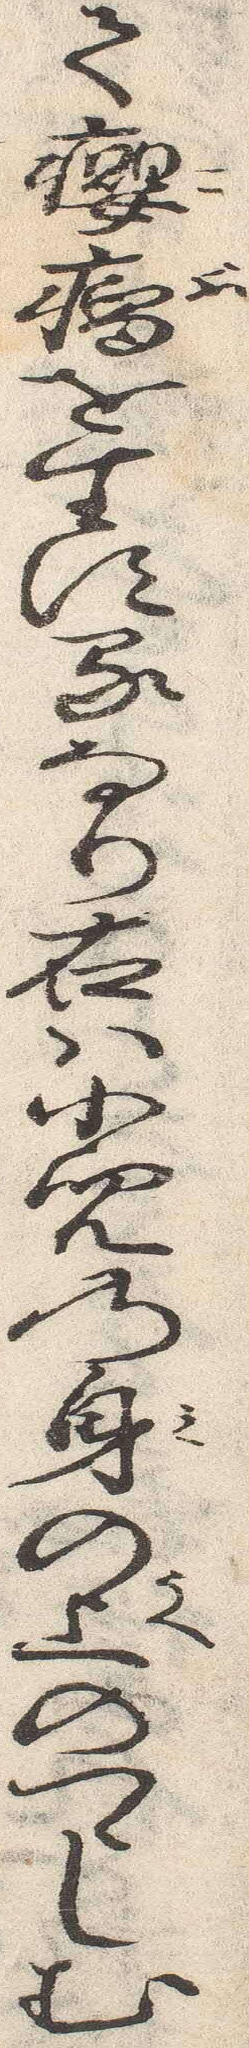て癭瘤を生するなり右は小児の身の上のつつしむ
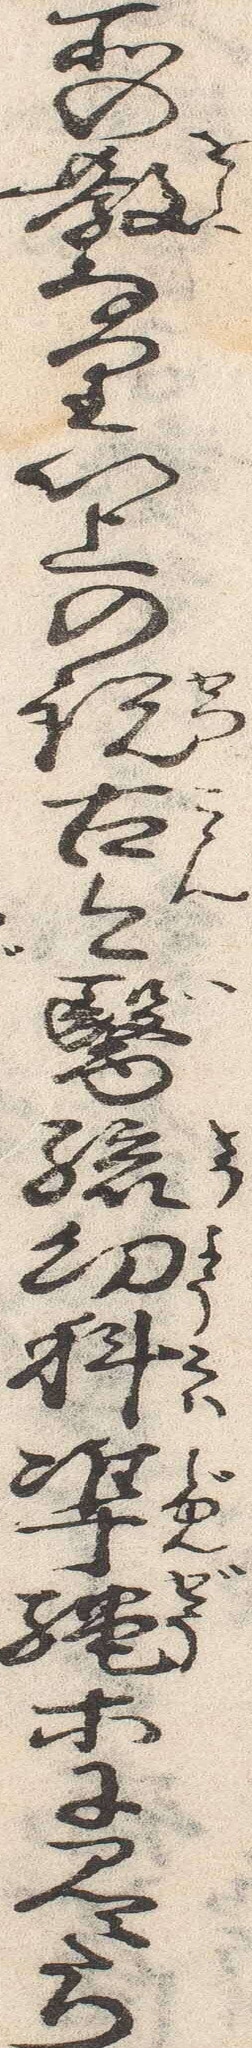所の教なり以上の説古今醫統幼科準縄等に見えたり
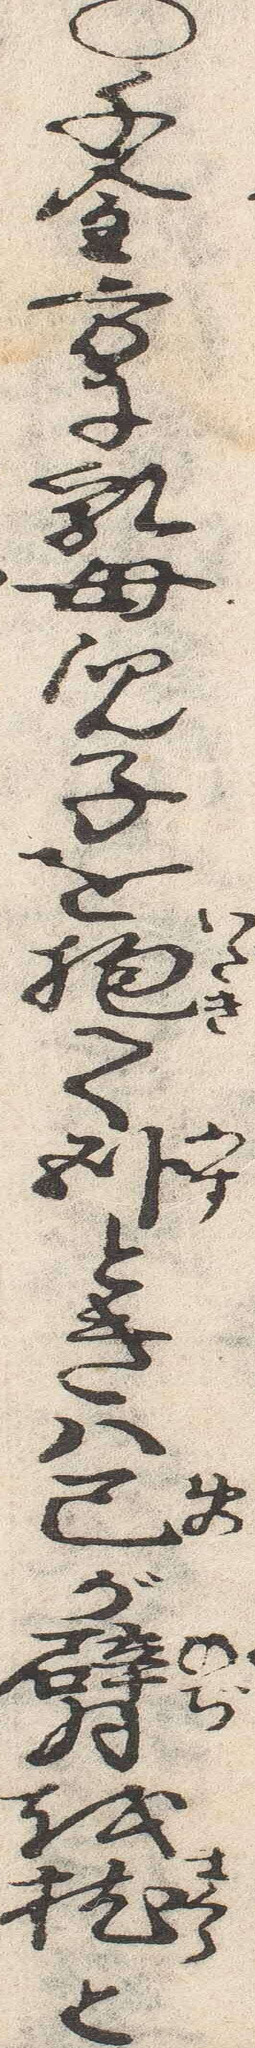◯千金方に乳母児子を抱て臥ときは己が臂を枕と
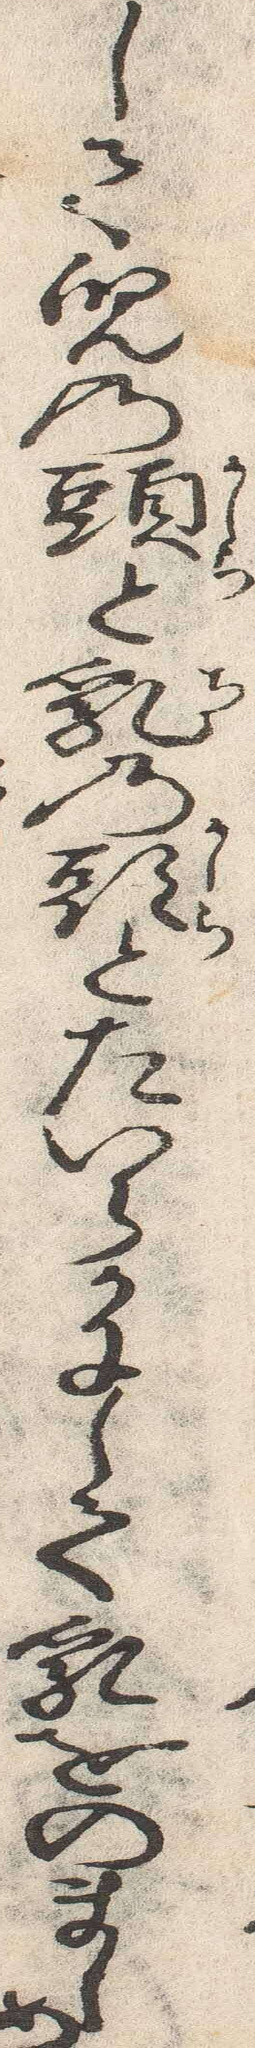して児の頭と乳の頭とたいらかにして乳をのましめ
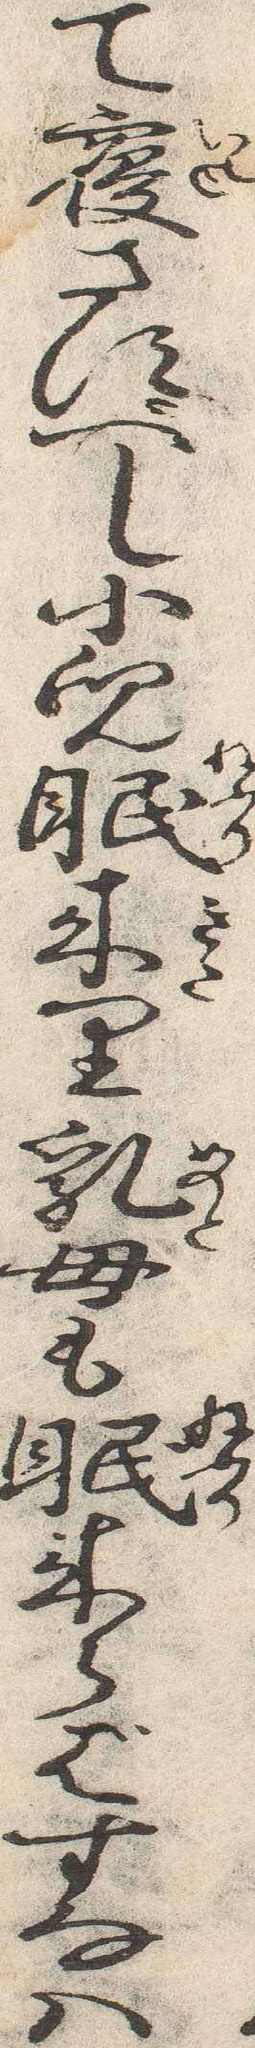て寝さすべし小児眠來り乳母も眠来らばすなは
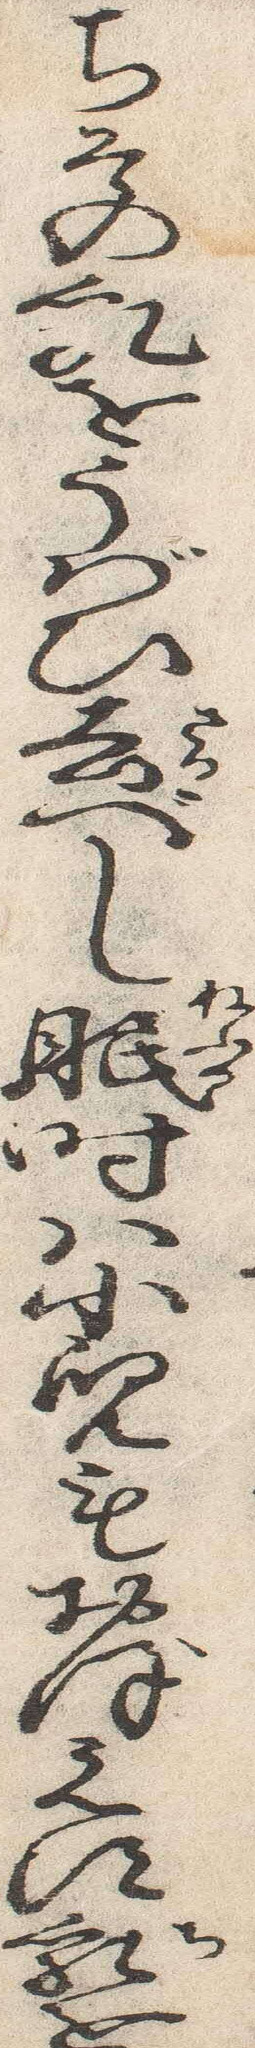ちその乳をうばひ去べし眠時は小児もおぼえす乳を
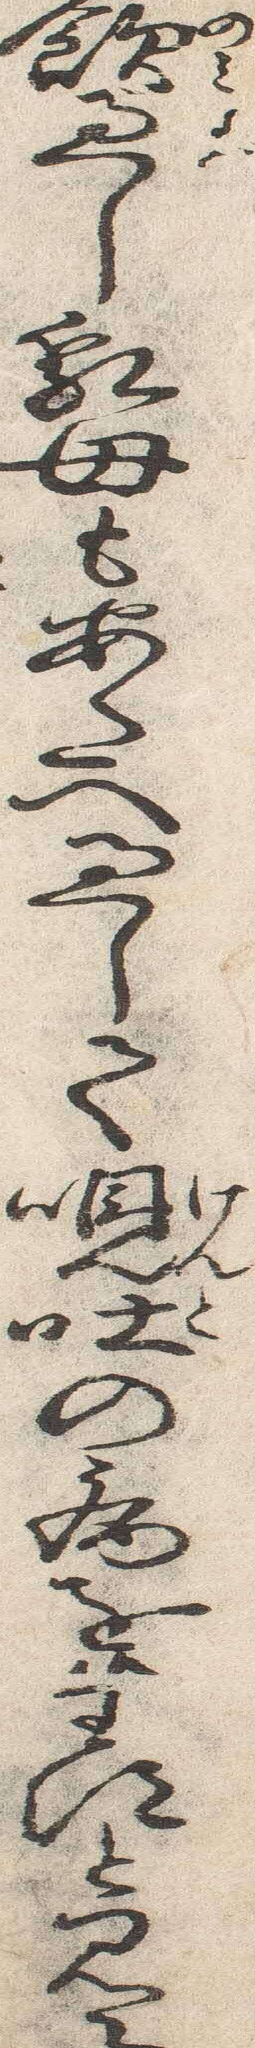飲過し乳母もあたへ過して哯吐の病を生すと見え
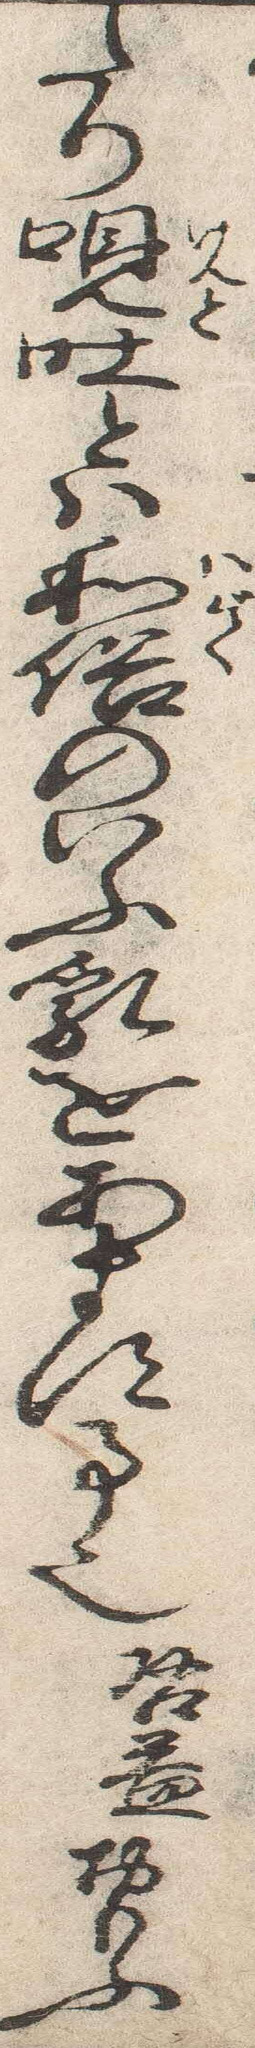たり哯吐とは和俗のいふ乳をあます事也啓益おもふ
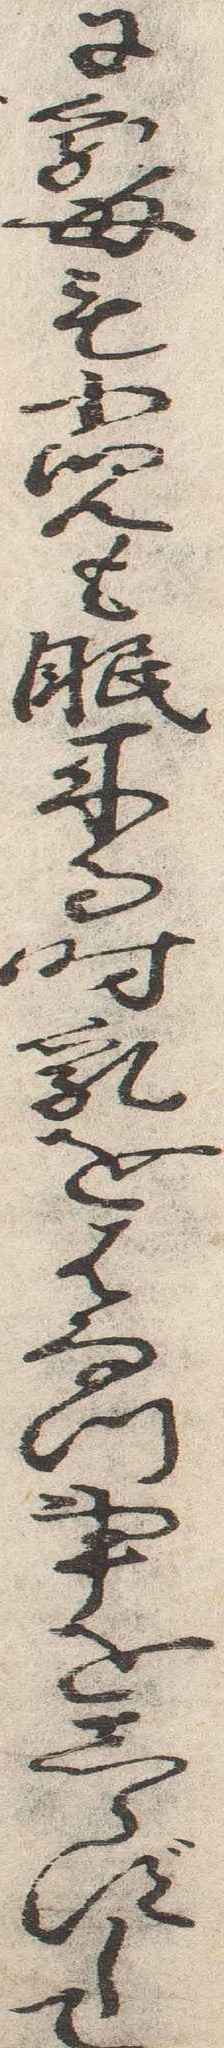に乳母も小児も眠来る時乳をはなつ事をしらずして
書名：小児必用養育草
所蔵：東京学芸大学附属図書館 国文学研究資料館
